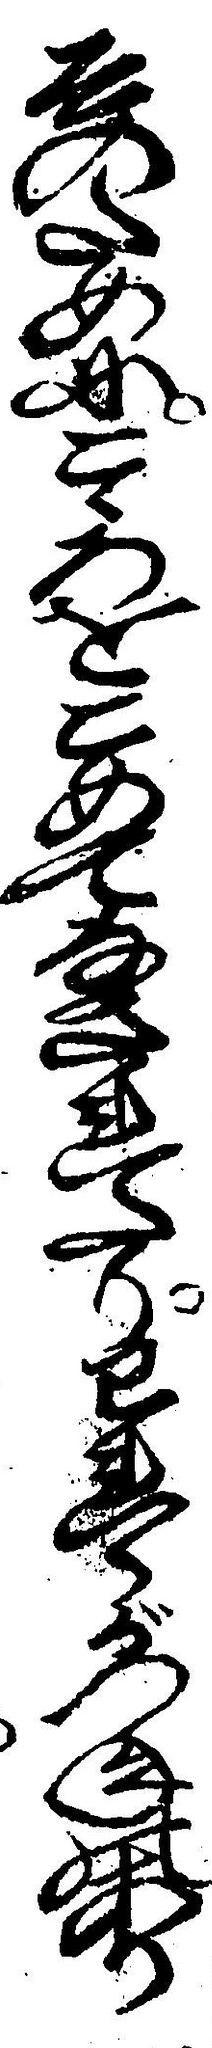そのために。こゝろをこめてなされたり。われらがつねのあり
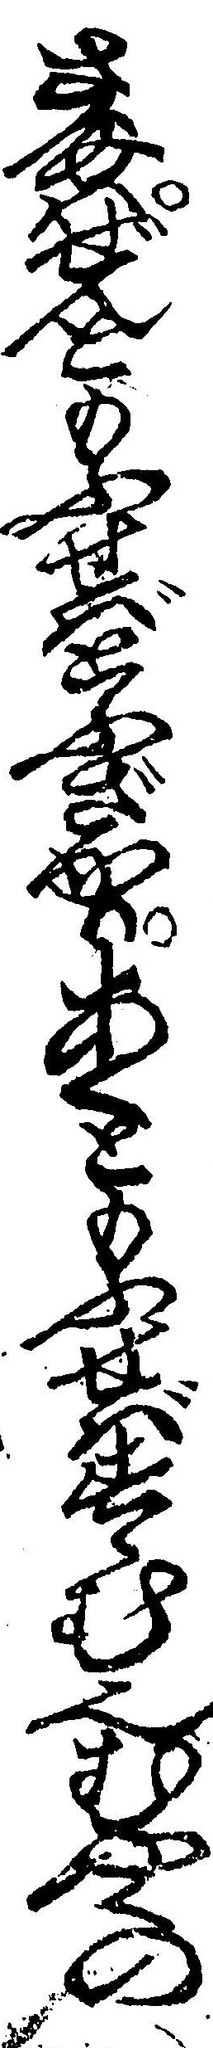さまは。ぜんともふせばとふざかり。あくともふせばすゝむ也。むやくの
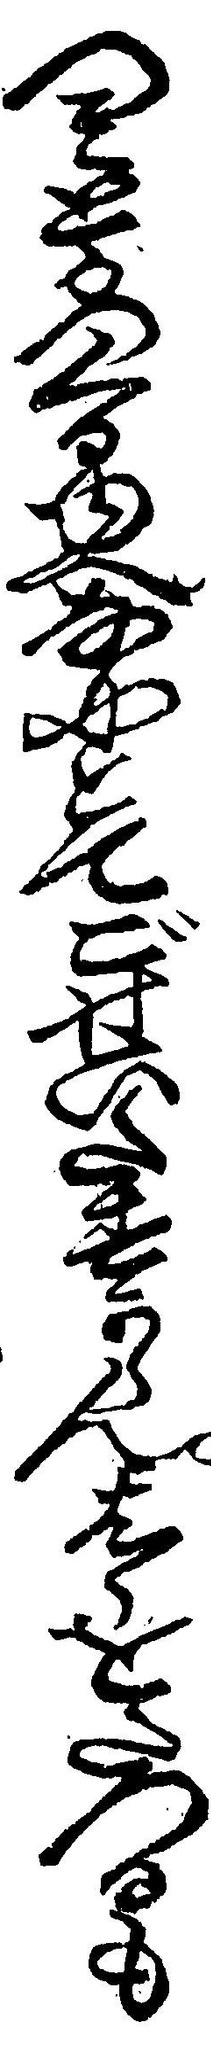つみとかつくるゆへ。なにとてごせいたすからん。はらをたつるも
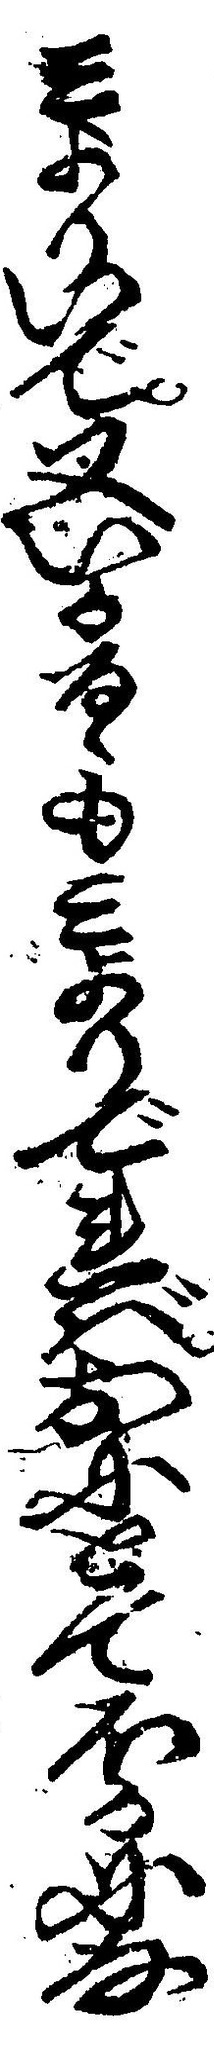みよりいで。又いかるゝもみよりでれば。おにとてほかにな
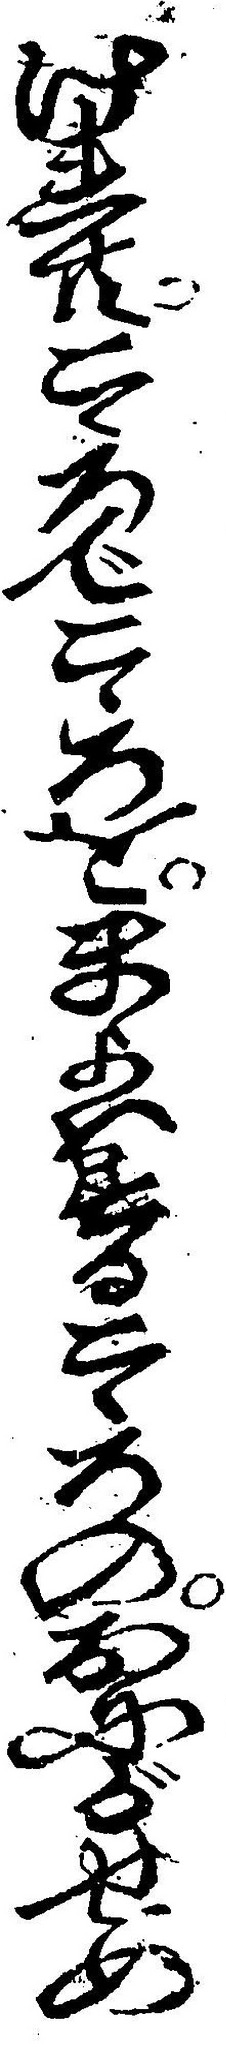けれ共。こゝろでこゝろを。まよいするこゝろの。おにがせめ
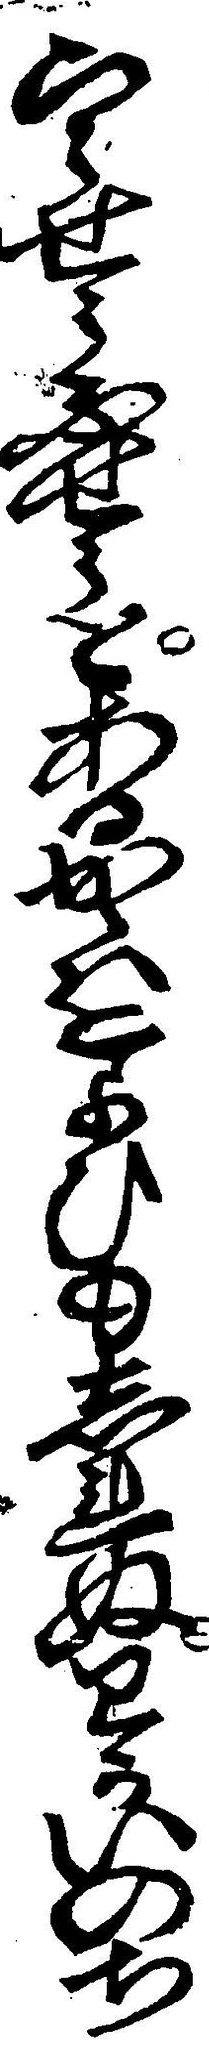らうせうふせうと。あるからはこよひもしれぬ。わかいのち
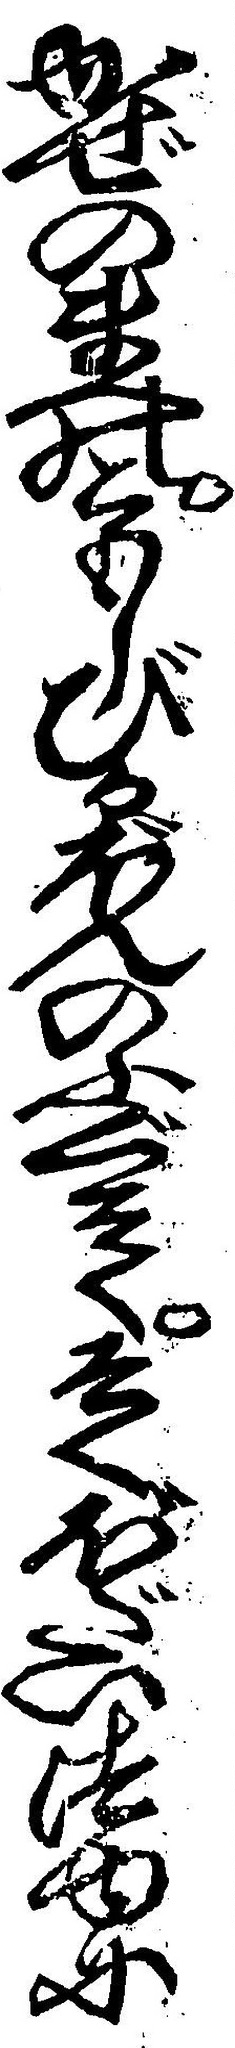かぜのまへの。ともしびがほんのふぐそく。そくぼだいつゆに
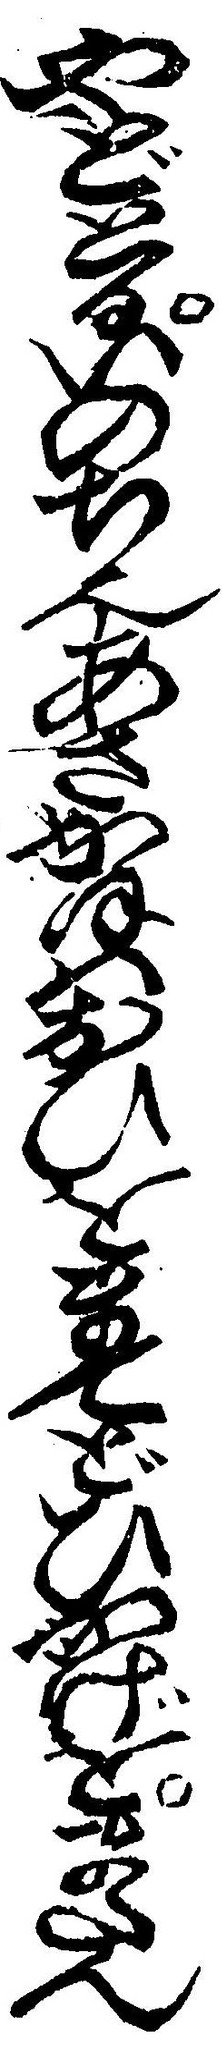やどとる。いのち也あさかほはおひをまてどひかげを。またん
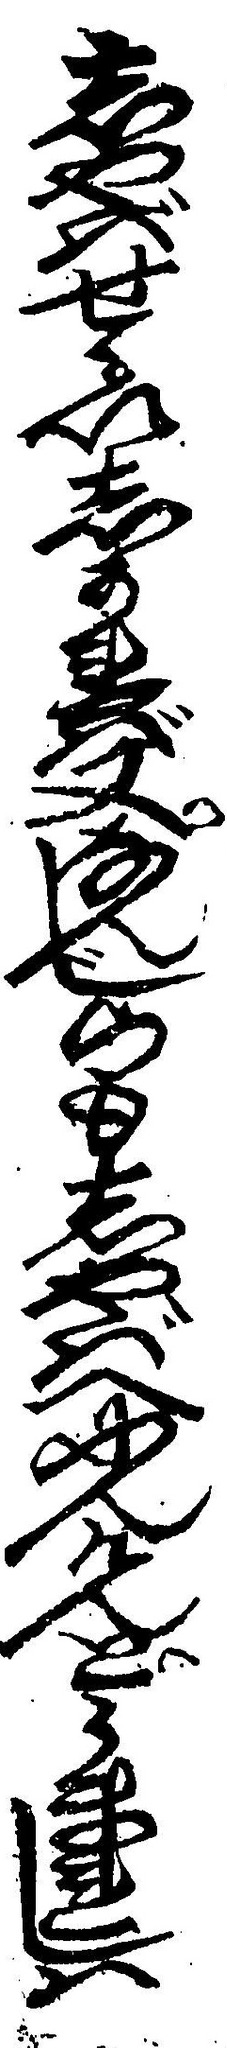しやばせかいしかれば又。なんぢらもしやばへにんけんと。うまれしは
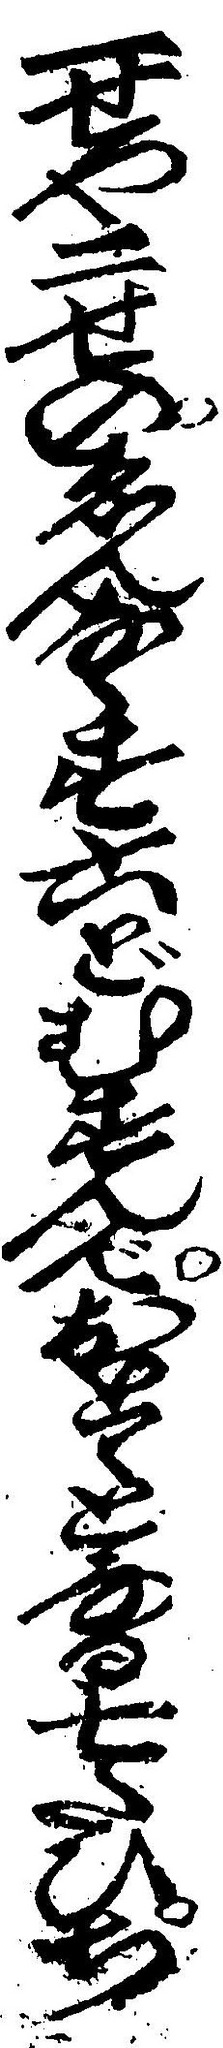一せや二せの。ゑんならす六どむすんで。おとゝとなる七たひ。ち
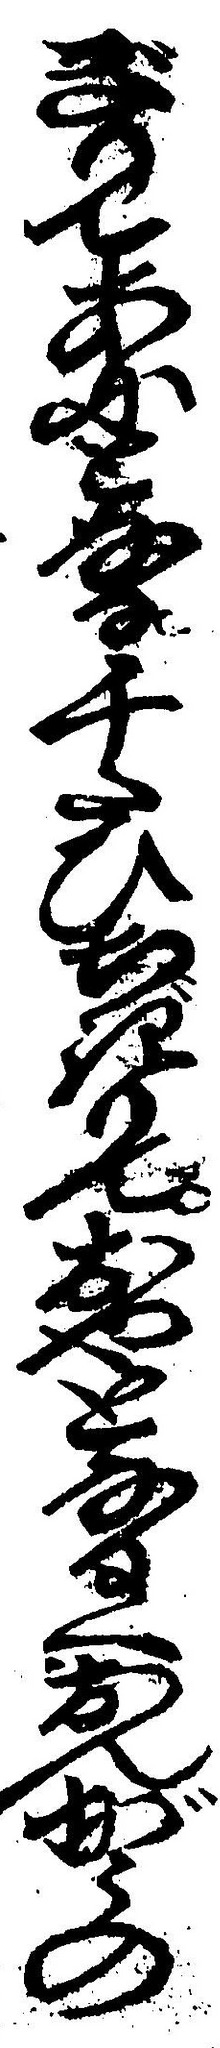ぎりてあにとなる。千たひちぎりて。おやとなる一おんがうの
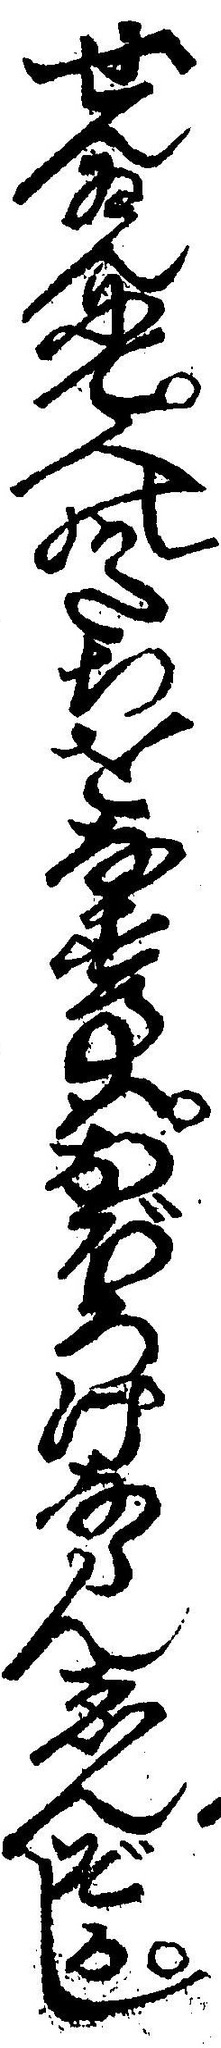ぜんゐんにて。人のかたちをなす事は。おぼろけならんゑんぞかし。
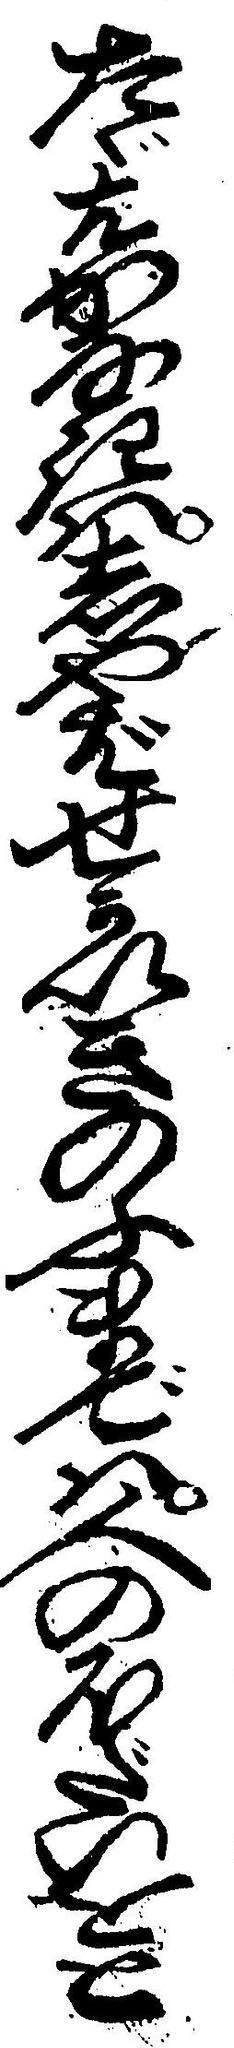たゞはかなきは。しやばせかいきのふまでは。人のほだいをと
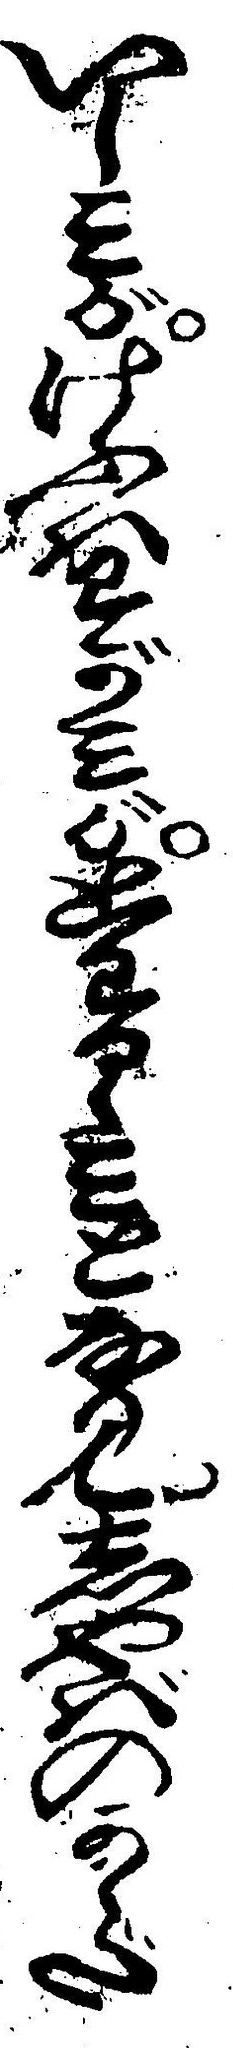いしみが。けふはわがみが。とわるゝみとなりて。しやばのからだ

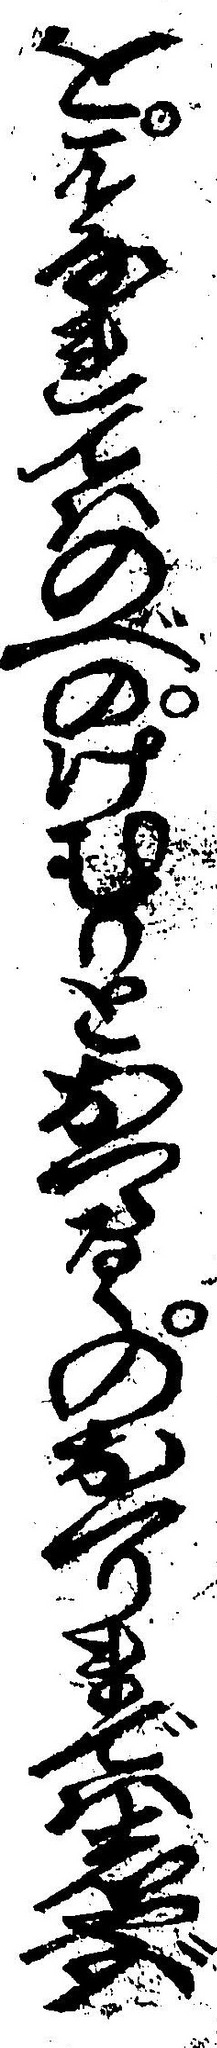を。はなれてはのべの。けむりとおくらるゝ。のおくりまではしやば
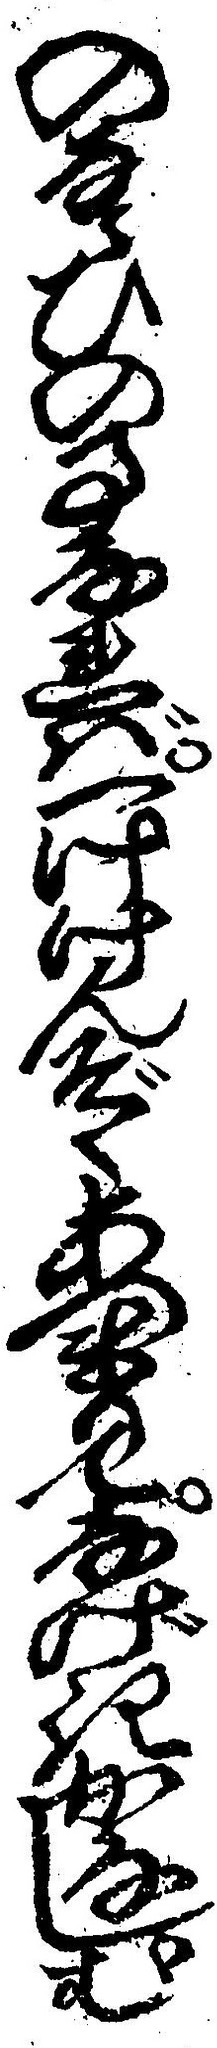のならひの事なれば。一けけんぞくあつまりて。なげきかなしむ
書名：目連尊者地獄めくり / 宇留藤太夫正本
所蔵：東京大学総合図書館 General Library in the University of Tokyo, JAPAN
